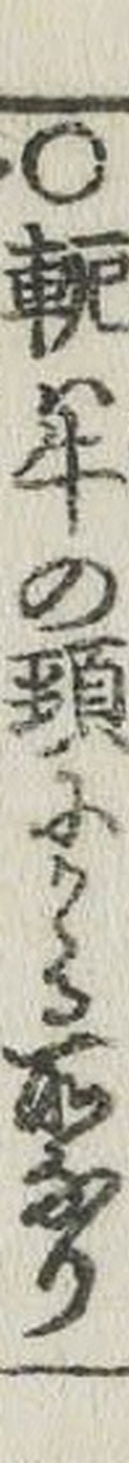○軛は牛の頸にかゝる所なり
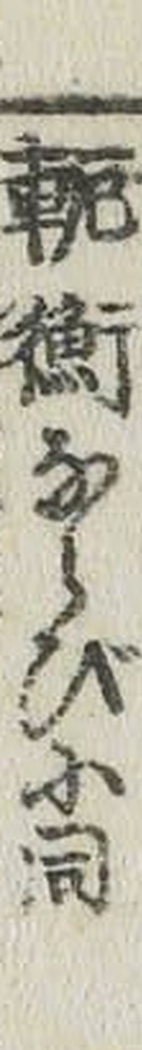軛衡ならびに同
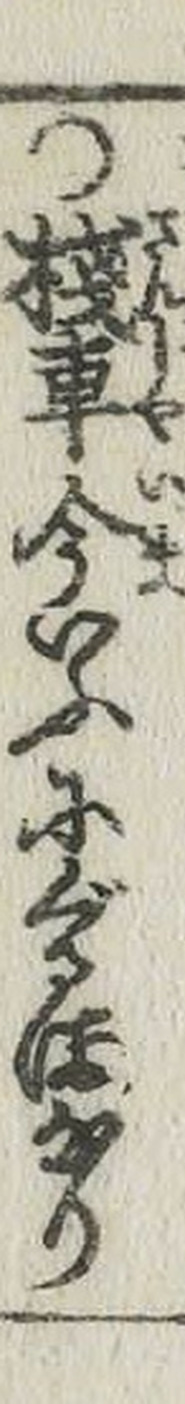○桟車今いふにぐるまなり

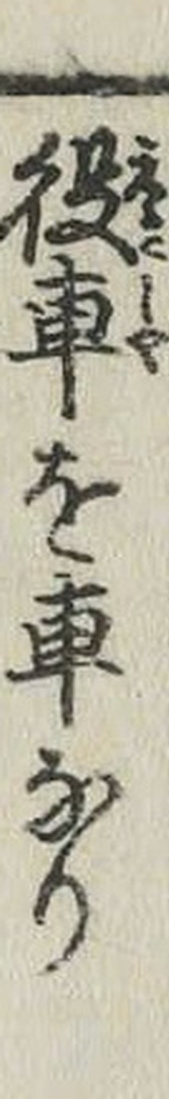役車を車なり
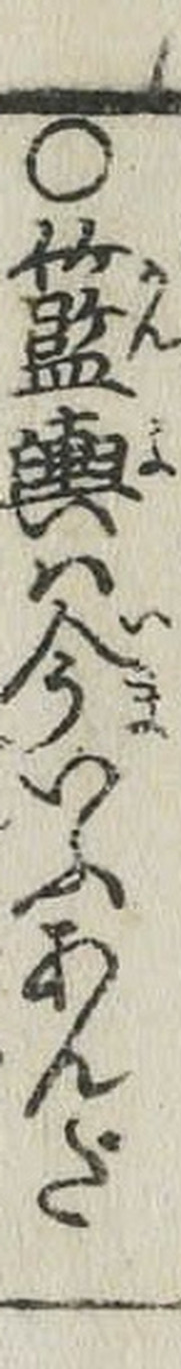○籃輿は今いふあんだ
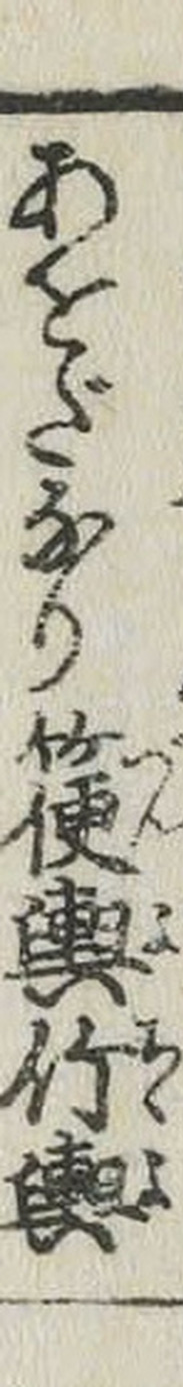あをだなり箯輿竹輿
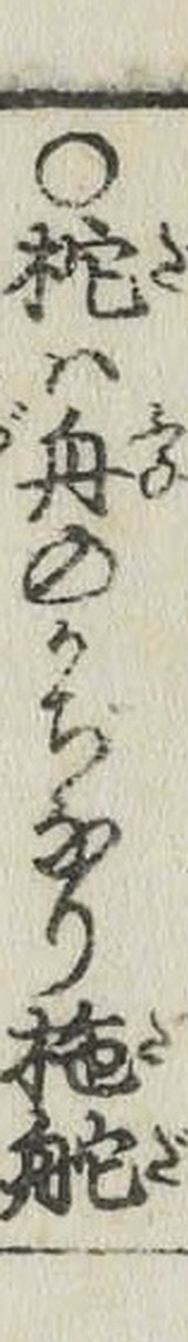○柁は舟のかぢなり柂舵
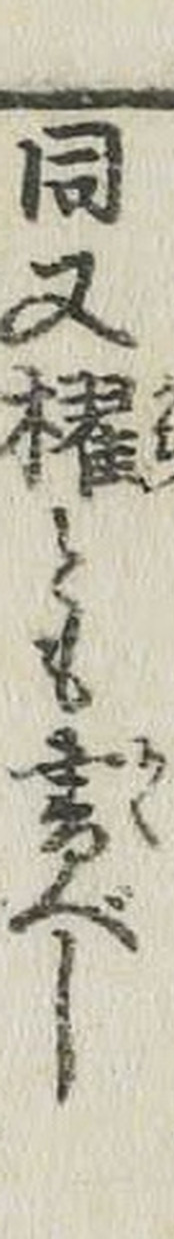同又櫂とも書べし
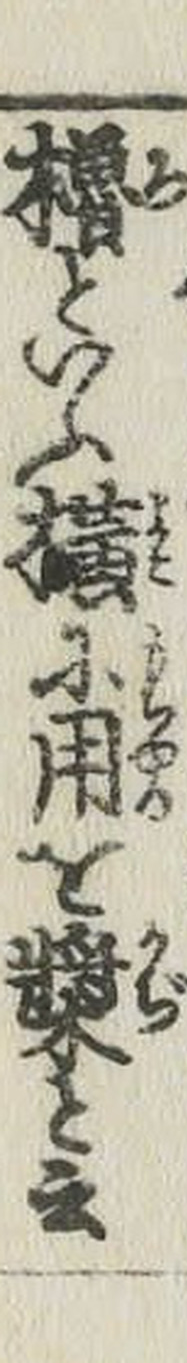櫓といふ横に用を槳と云
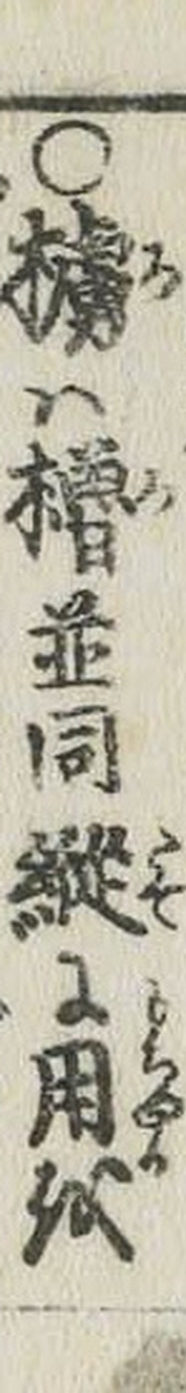○㯭は櫓並同縦に用を
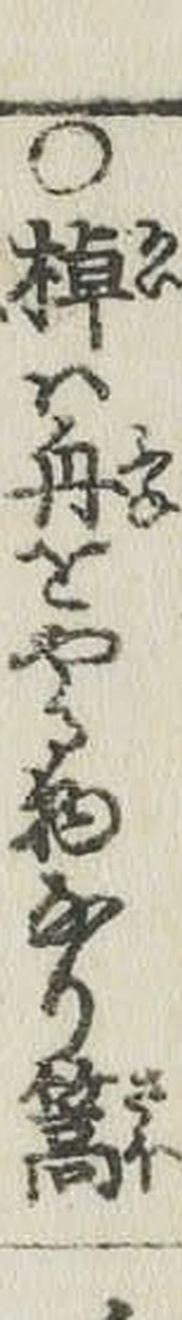○棹は舟をやる物なり篙
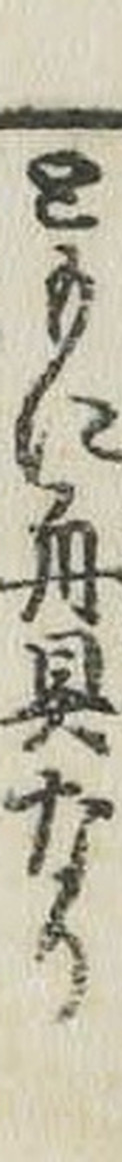ともに舟具なり
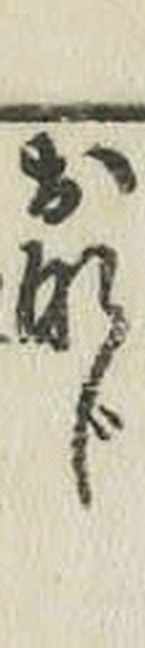おなじ
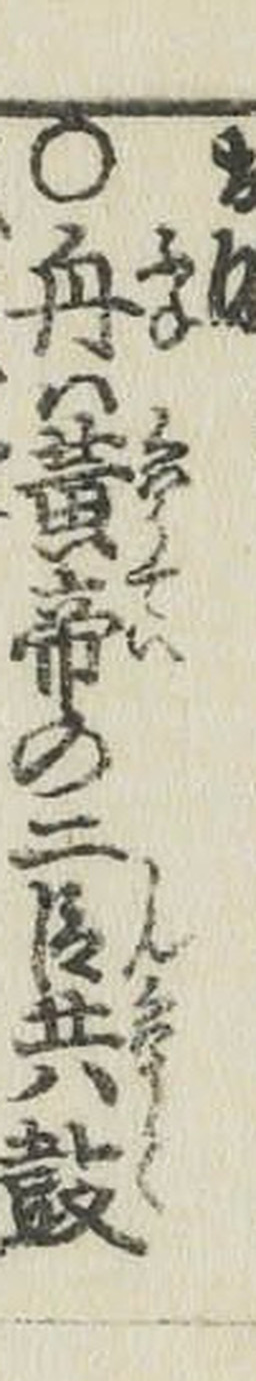○舟は黄帝の二臣共鼓
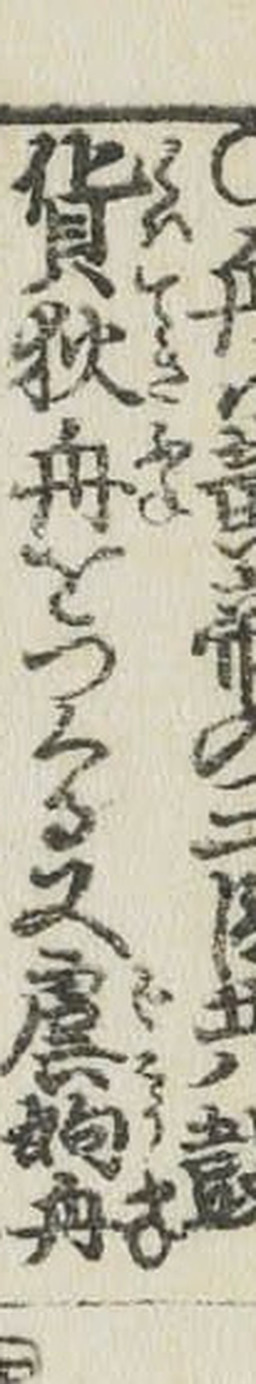貨狄舟をつくる又虞姁舟
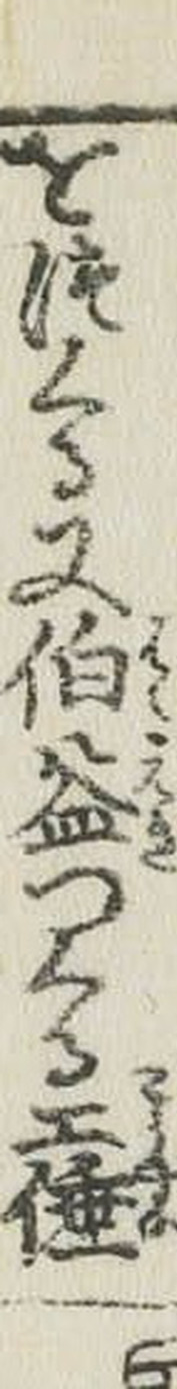をつくる又伯益つくる工倕
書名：増補頭書訓蒙図彙大成 10巻 5:巻之9-11
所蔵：東京学芸大学教育コンテンツアーカイブ
